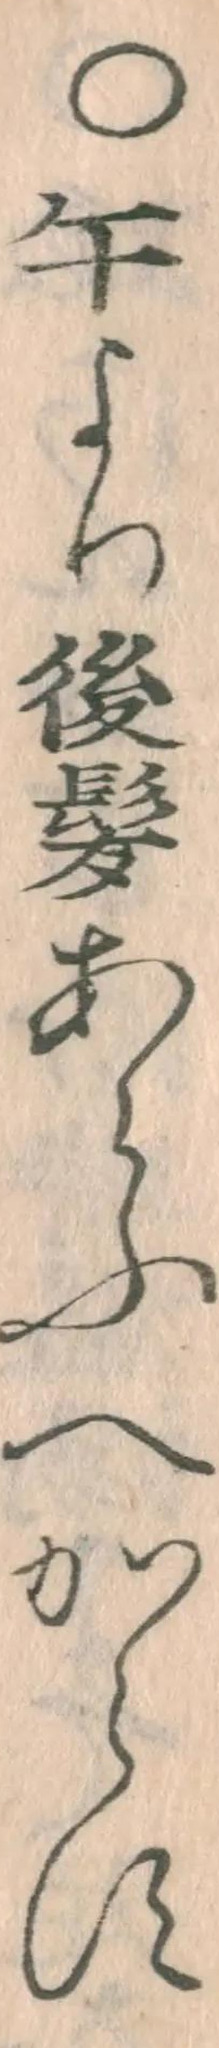〇午より後髪あらふへからす
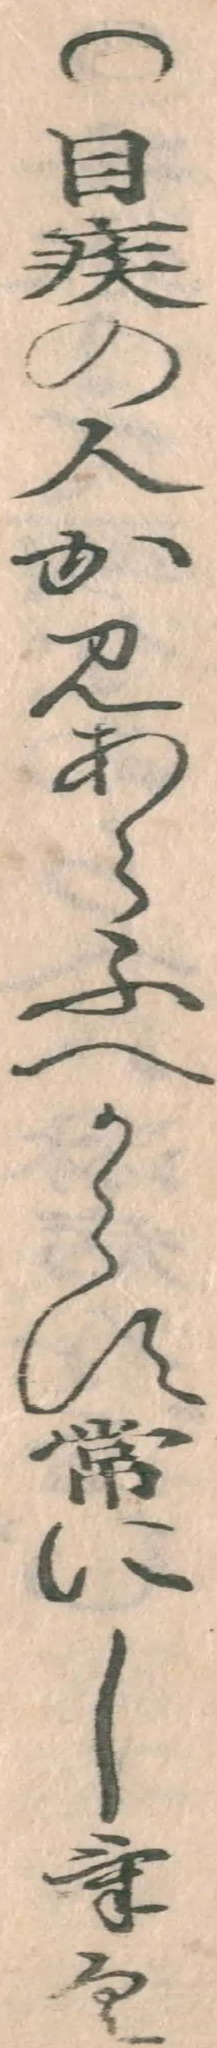〇目疾の人かみあらふへからす常にしけく
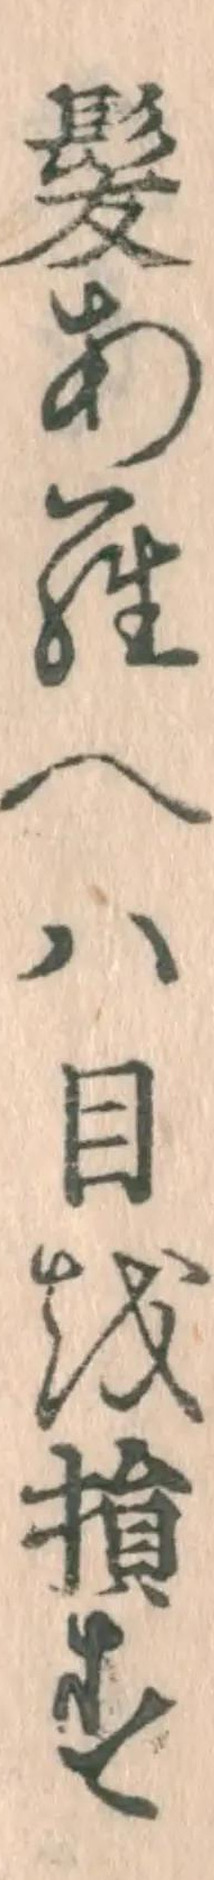髪あらへは目を損す
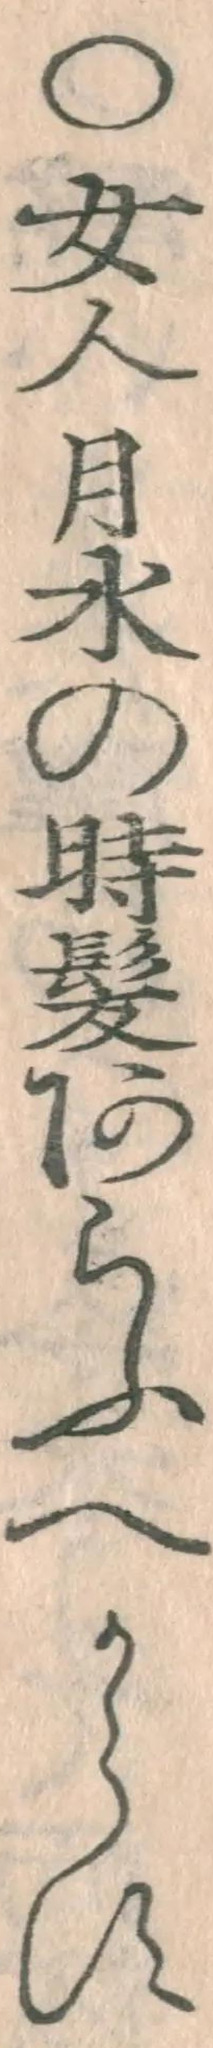〇女人月水の時髪あらふへからす
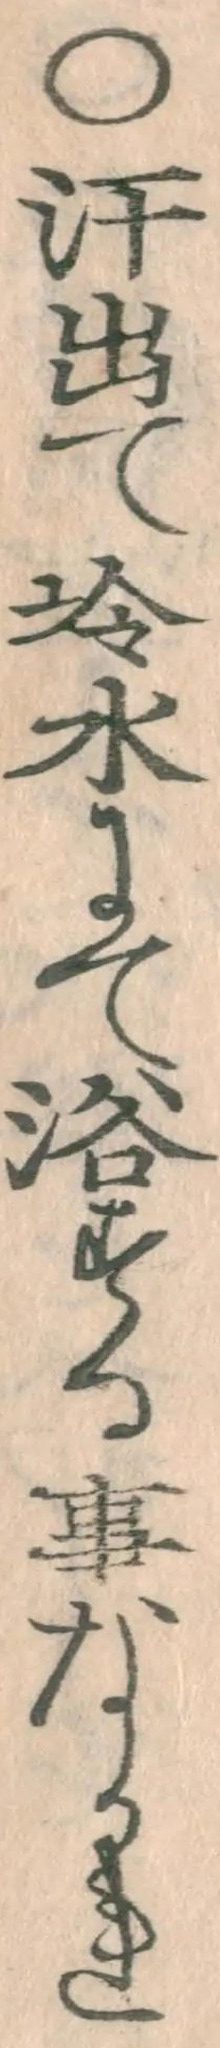〇汗出て冷水にて浴する事なかれ

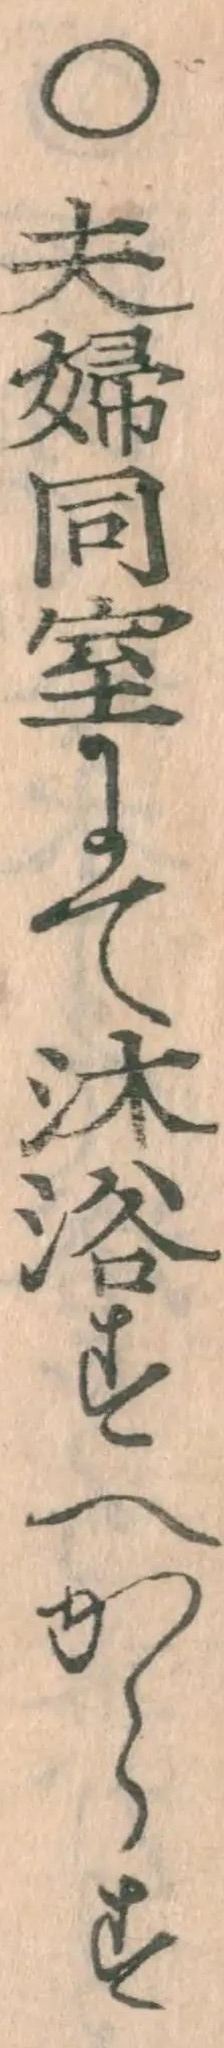〇夫婦同室にて沐浴すへからす
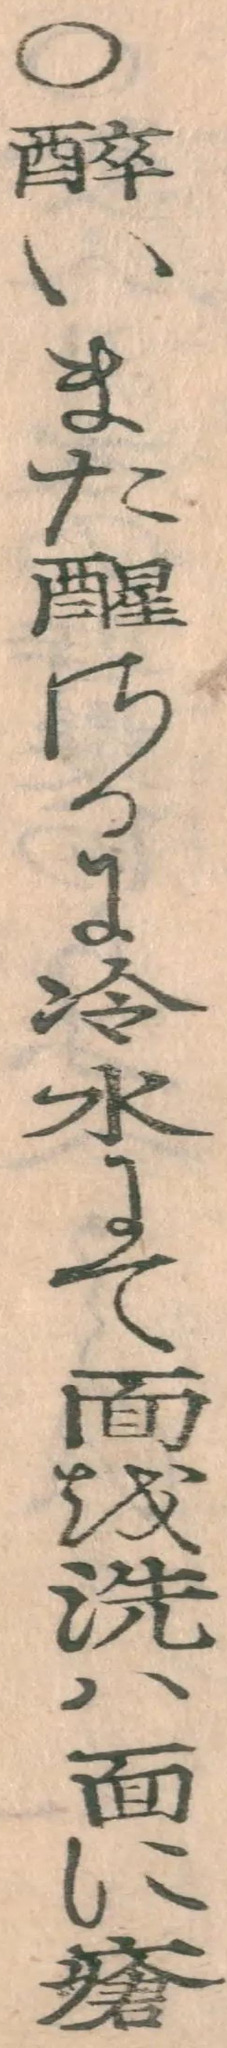〇酔いまた醒さるに冷水にて面を洗は面に瘡
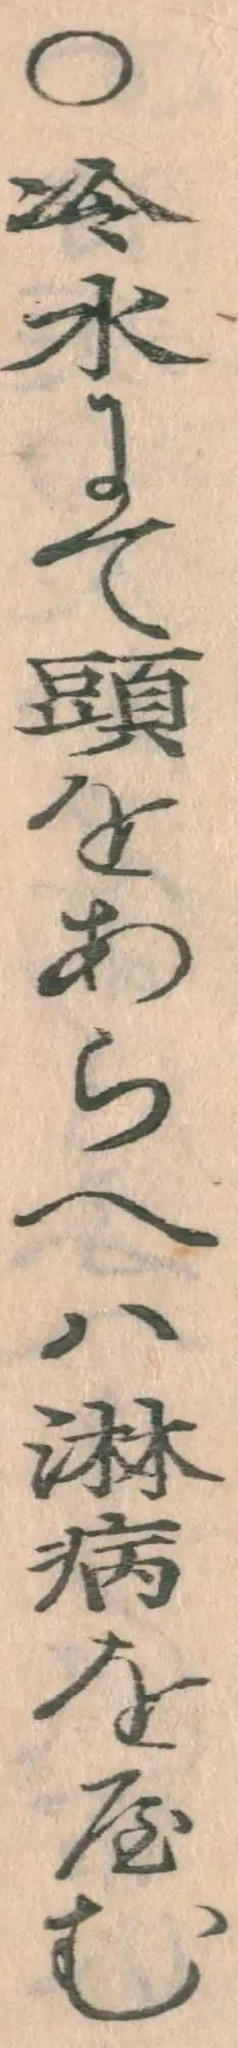〇冷水にて頭をあらへは淋病をやむ
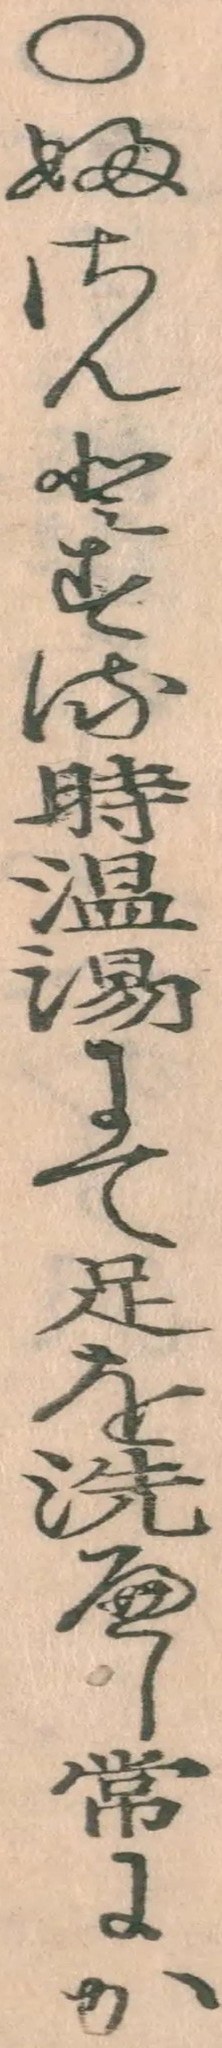〇ふさんとする時温湯にて足を洗へし常にか
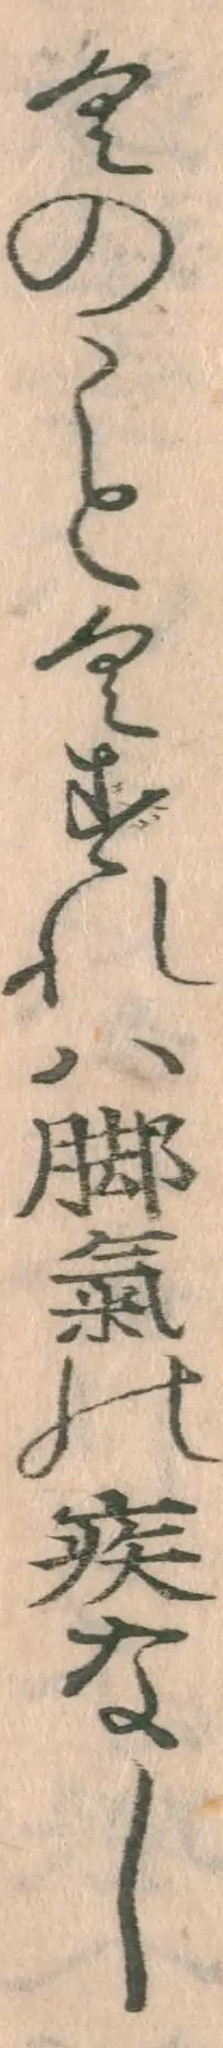くのことくすれは脚気の疾なし
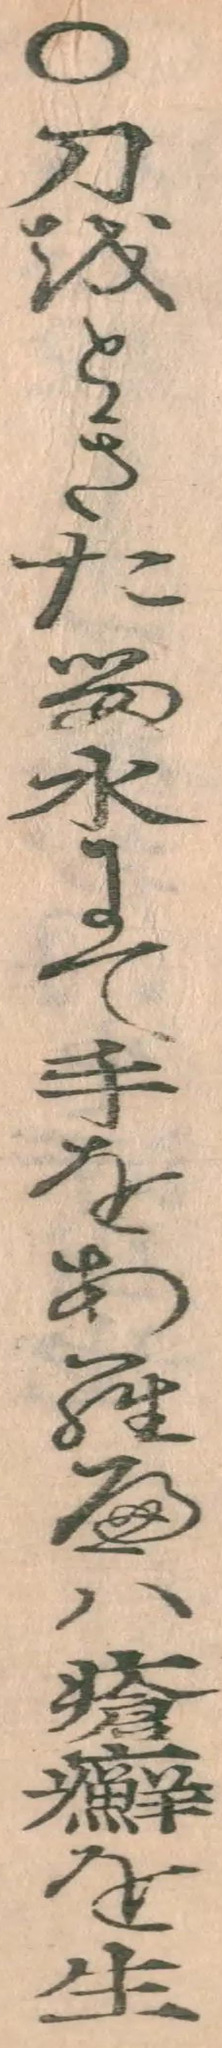〇刀をときたる水にて手をあらへは瘡癬を生
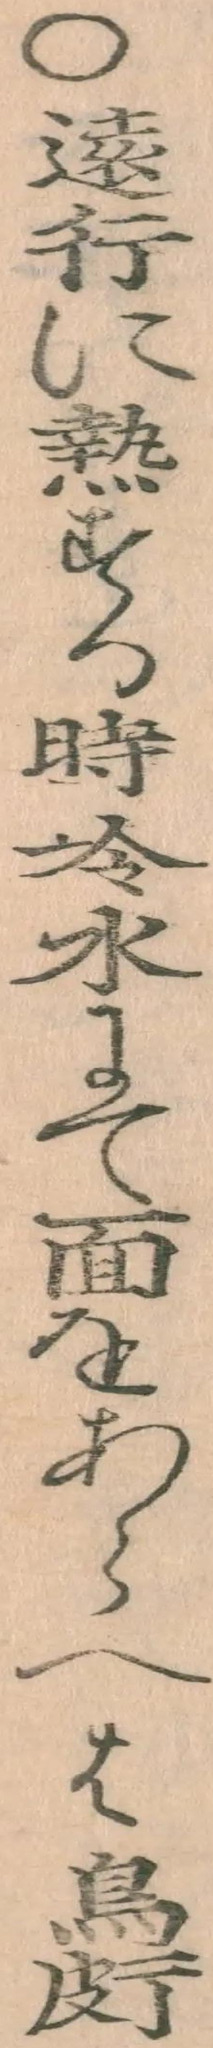〇遠行に熱する時冷水にて面をあらへは鳥皯
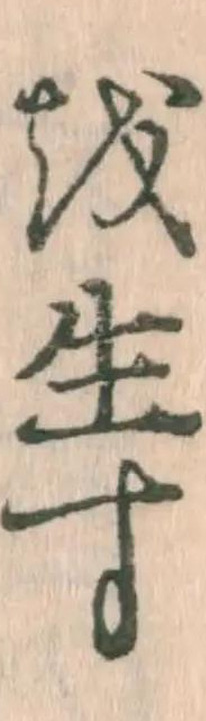を生す
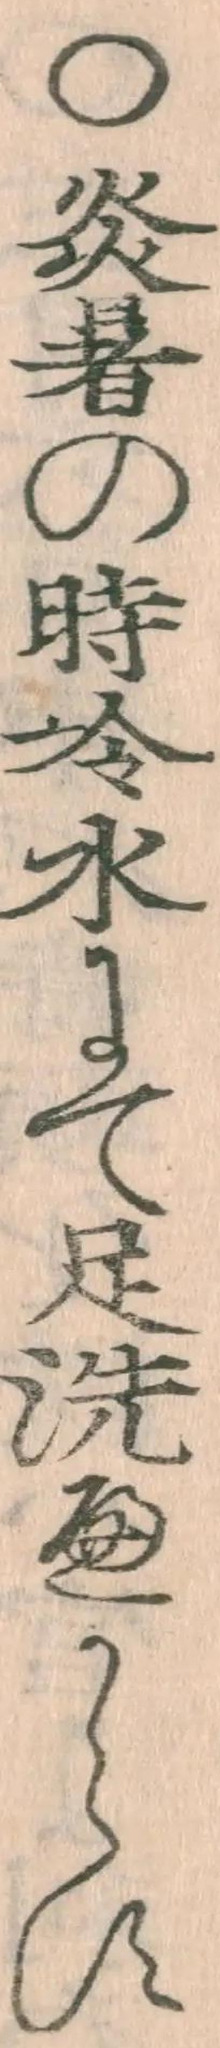〇炎暑の時冷水にて足洗へからす
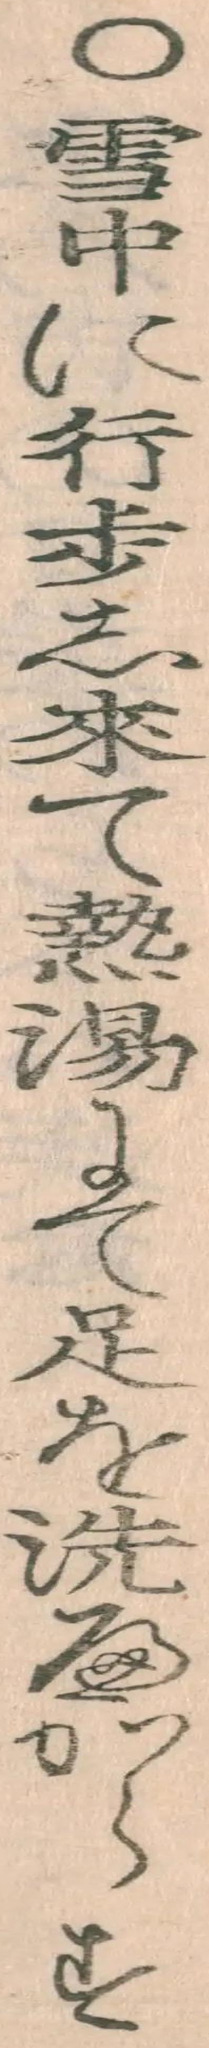〇雪中に行歩し来て熱湯にて足を洗へからす
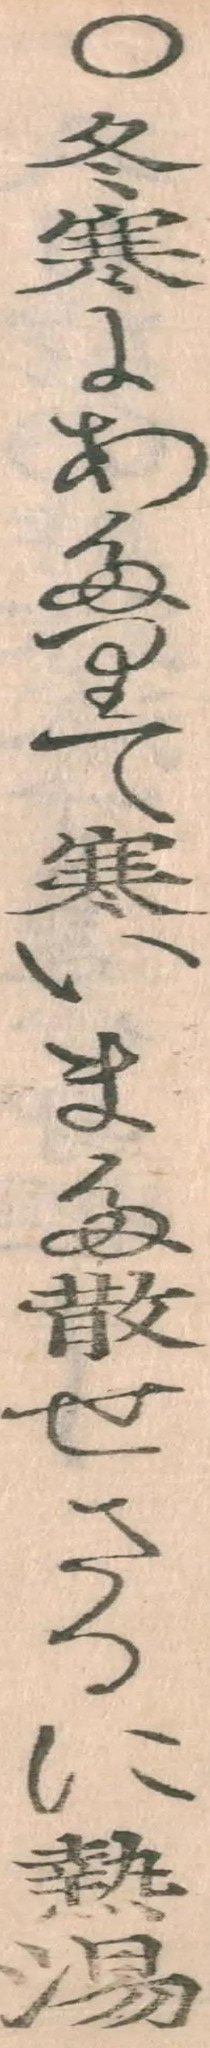〇冬寒にあたりて寒いまた散せさるに熱湯
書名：延壽撮要
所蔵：国立国会図書館 National Diet Library, JAPAN
